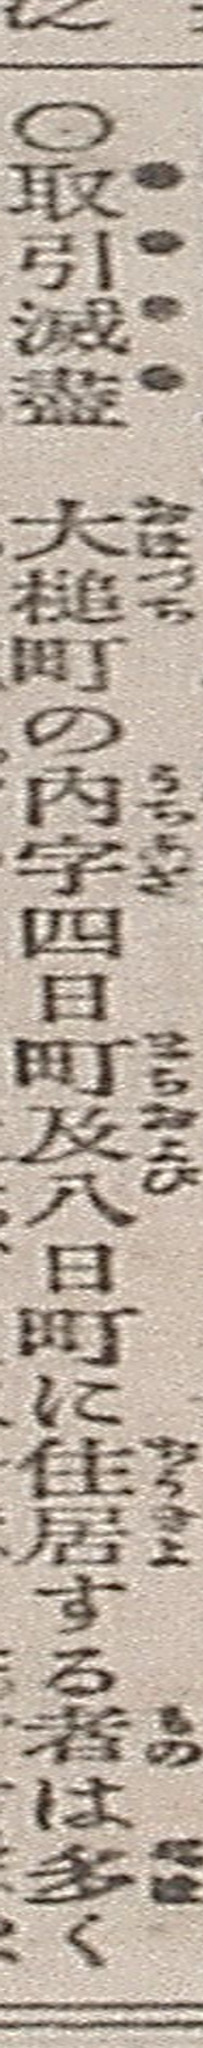○取引滅尽大槌町の内字四日町及八日町に住居する者は多く
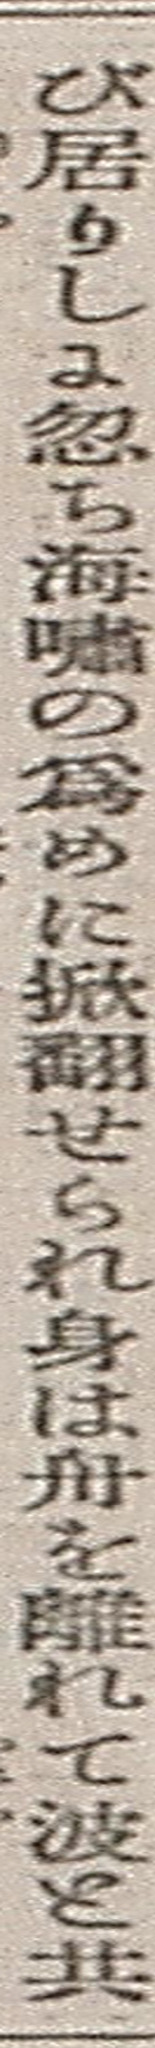び居りしに忽ち海嘯の為めに掀翻せられ身は舟を離れて波と共
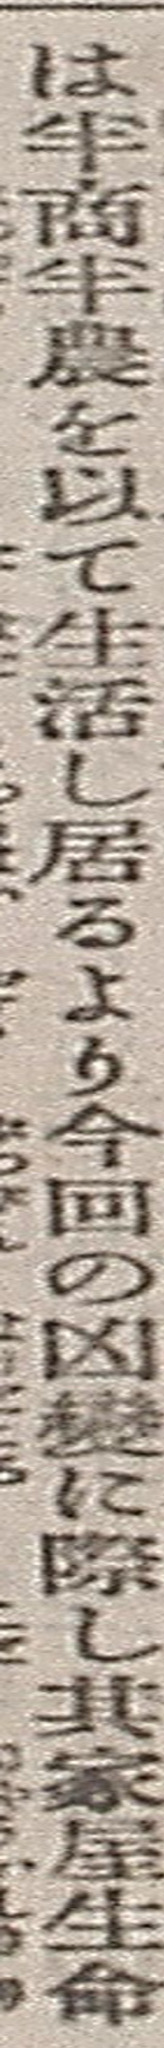は半商半農を以て生活し居るより今回の凶変に際し其家屋生命
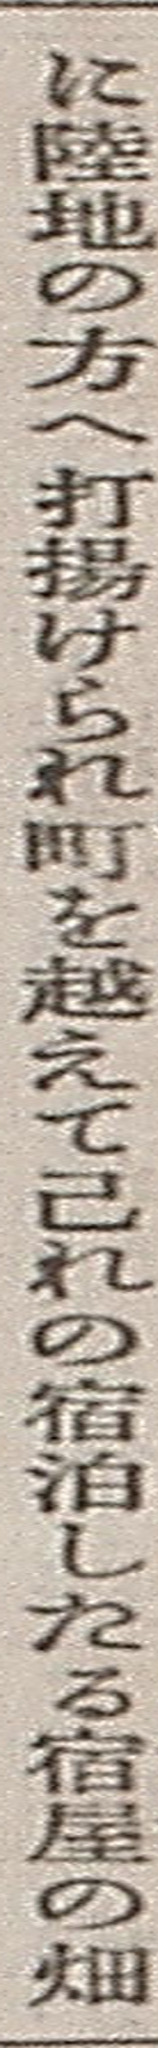に陸地の方へ打揚けられ町を越えて己れの宿泊したる宿屋の畑
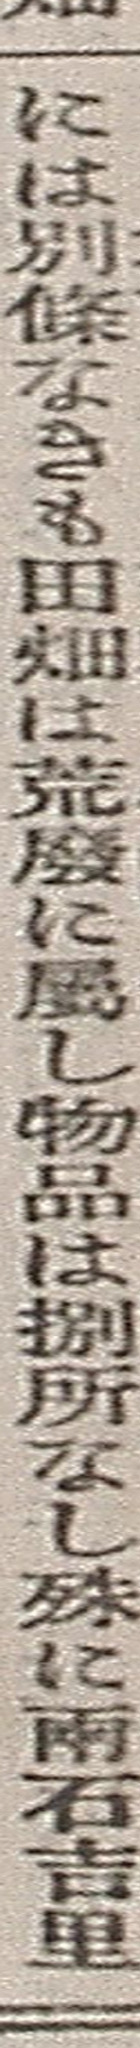には別条なきも田畑は荒廃に属し物品は捌所なし殊に両石吉里

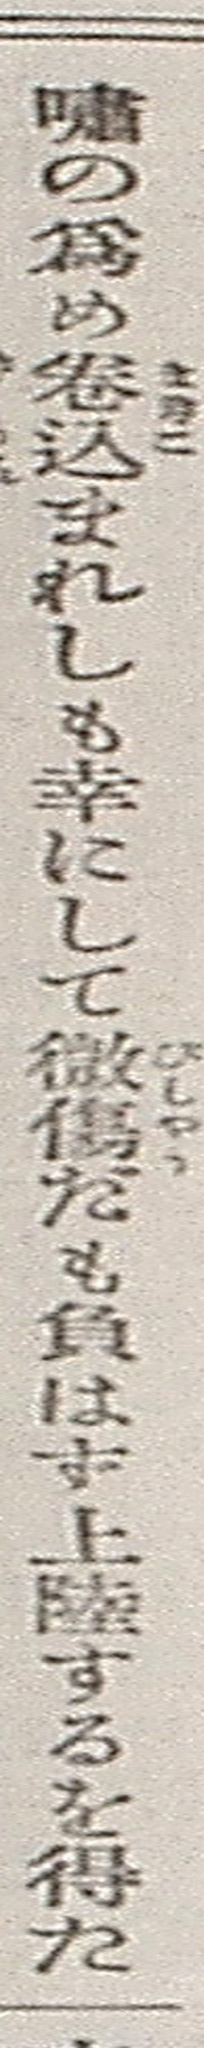嘯の為め巻込まれしも幸にして微傷だも負はず上陸するを得た
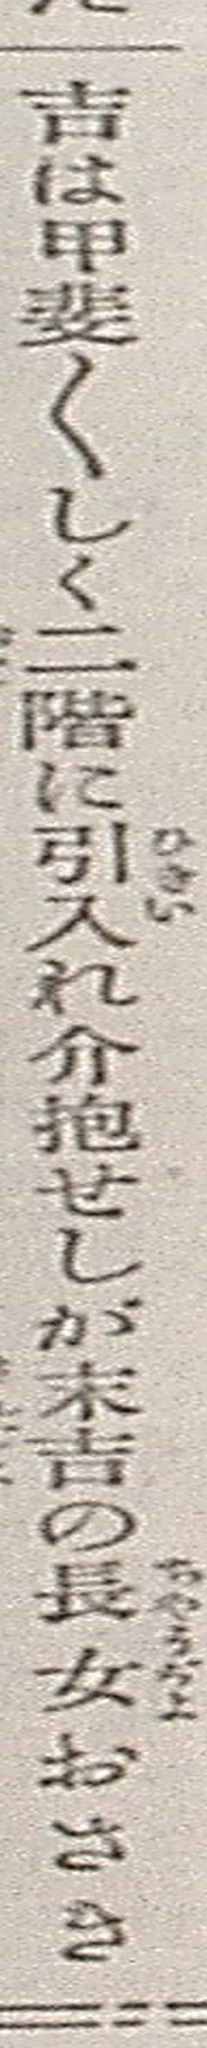吉は甲斐〳〵しく二階に引入れ介抱せしが末吉の長女おさき
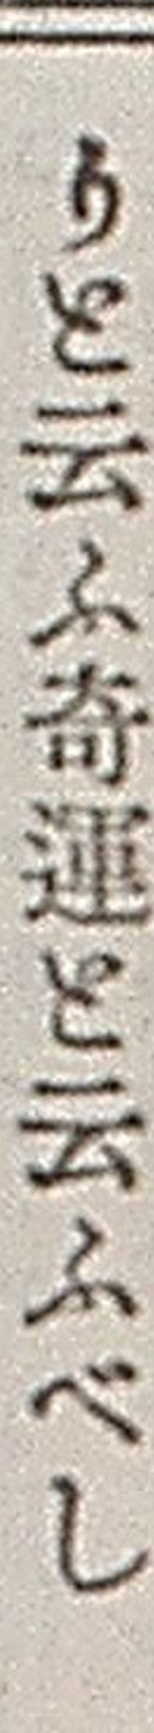りと云ふ奇運と云ふべし
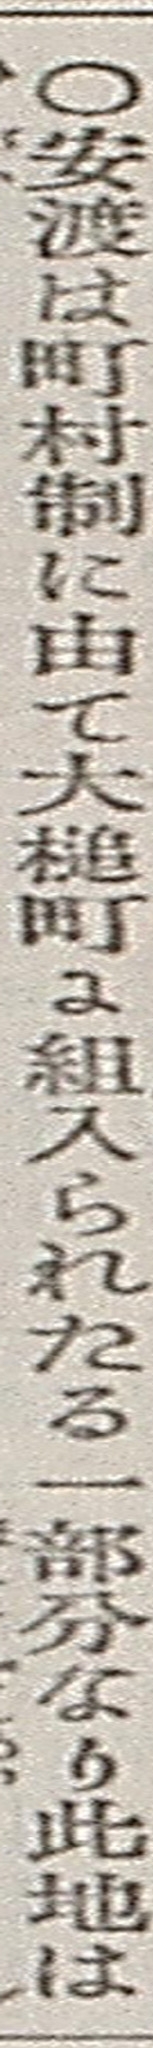○安渡は町村制に由て大槌町に組入られたる一部分なり此地は
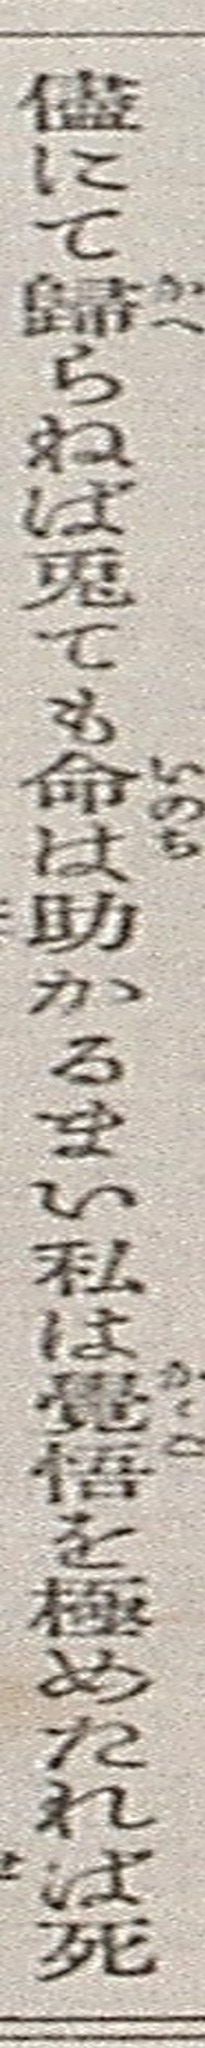侭にて帰らねば兎ても命は助かるまい私は覚悟を極めたれば死
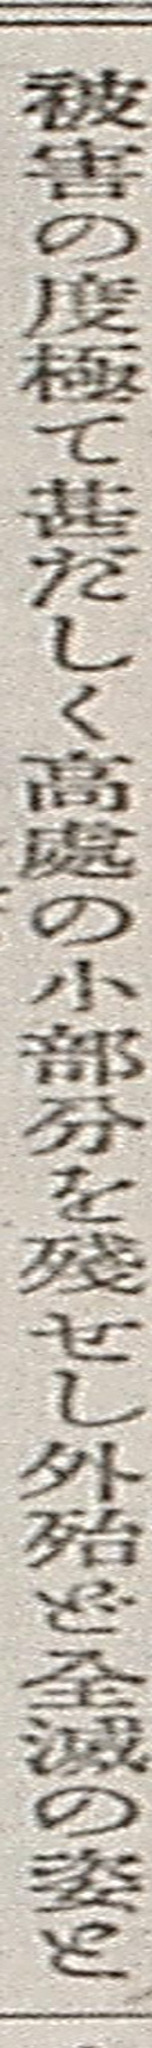被害の度極て甚だしく高処の小部分を残せし外殆ど全滅の姿と
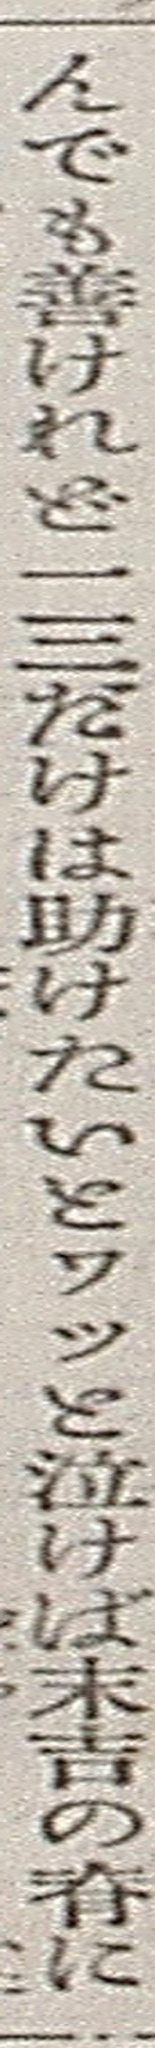んでも善けれど一三だけは助けたいとワッと泣けば末吉の背に
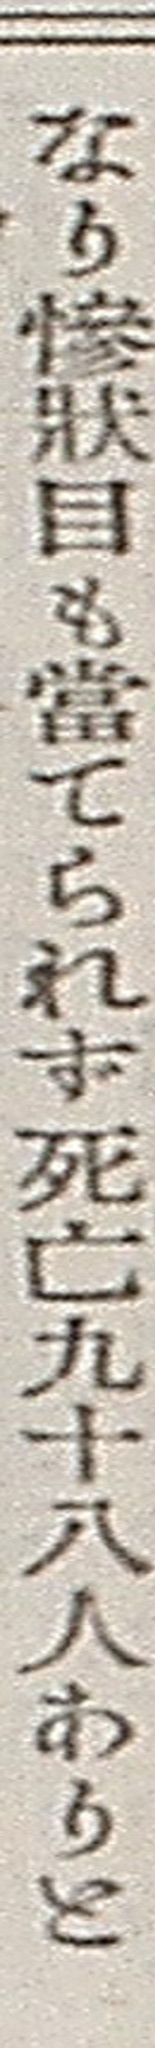なり惨状目も当てられず死亡九十八人ありと
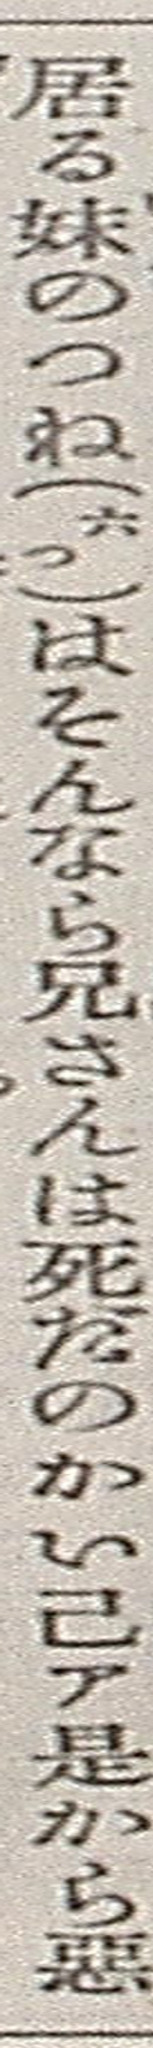居る妹のつねはそんなら兄さんは死んだのかい己ァ是から悪
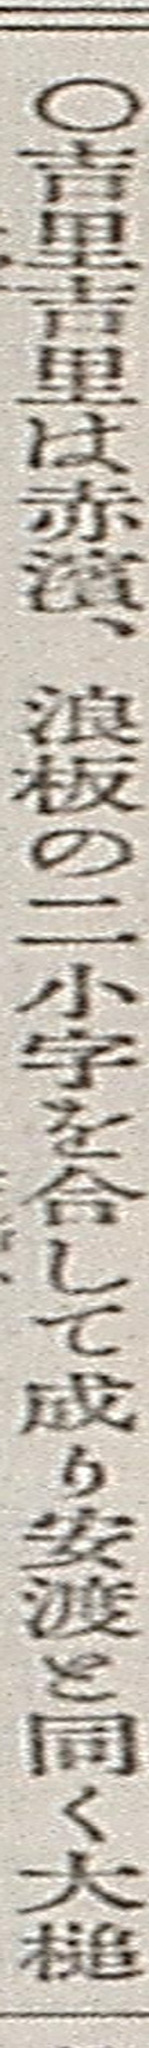○吉里吉里は赤浜、浪板の二小字を合して成り安渡と同く大槌
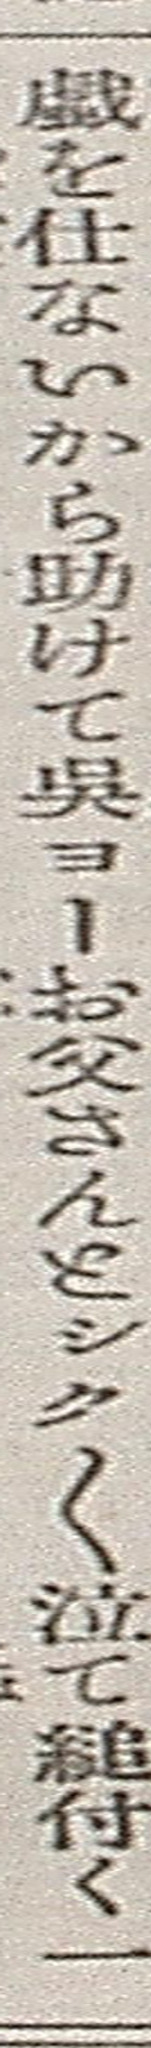戯を仕ないから助けて呉ヨーお父さんとシク〳〵泣て縋付く一
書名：風俗畫報臨時増刊第百十九號　大海嘯被害録（中）
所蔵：東京大学地震研究所図書室 Earthquake Research Institute Library, The University of Tokyo, JAPAN
